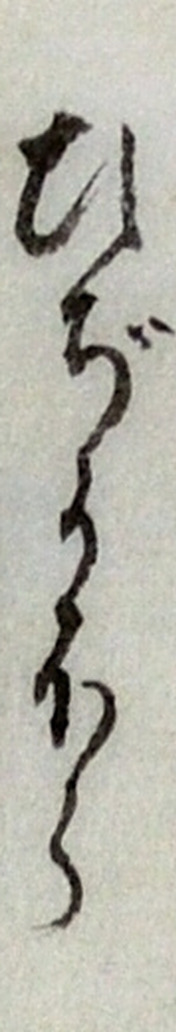ひぢかふり
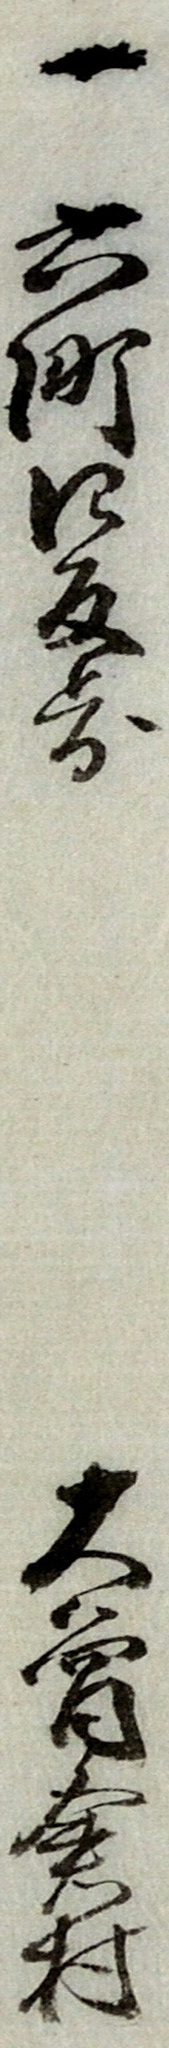一六町四反歩大曽倉村
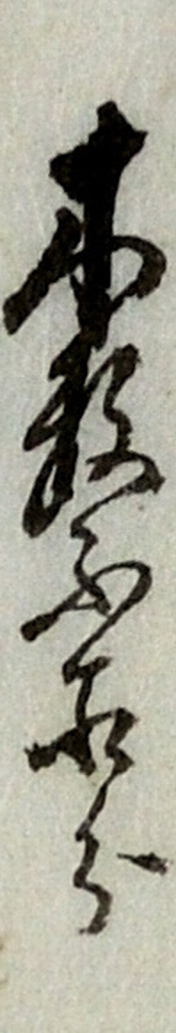木数不相分
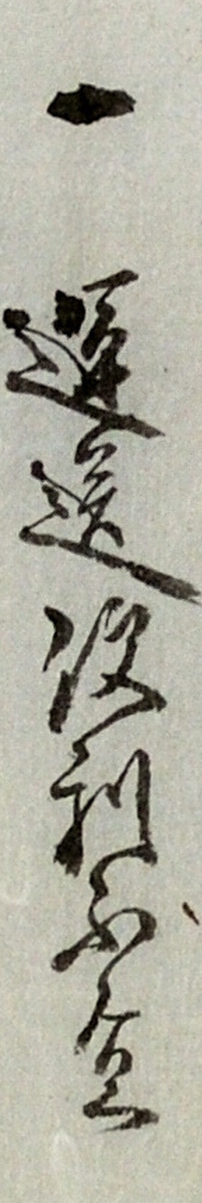一運送便利不宜

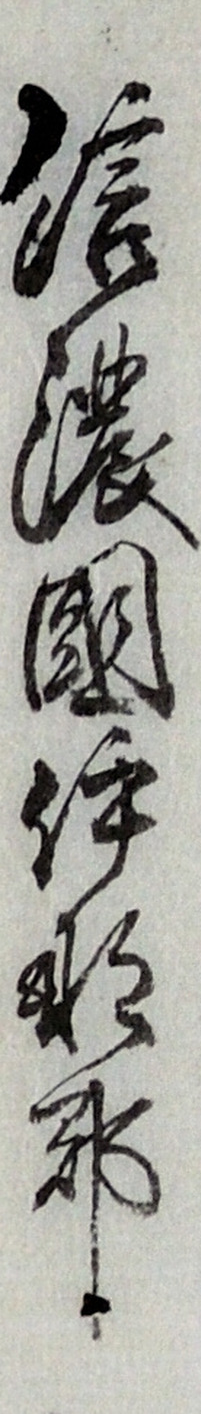信濃国伊那郡
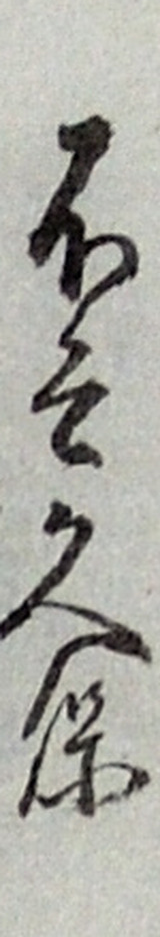不そ久保
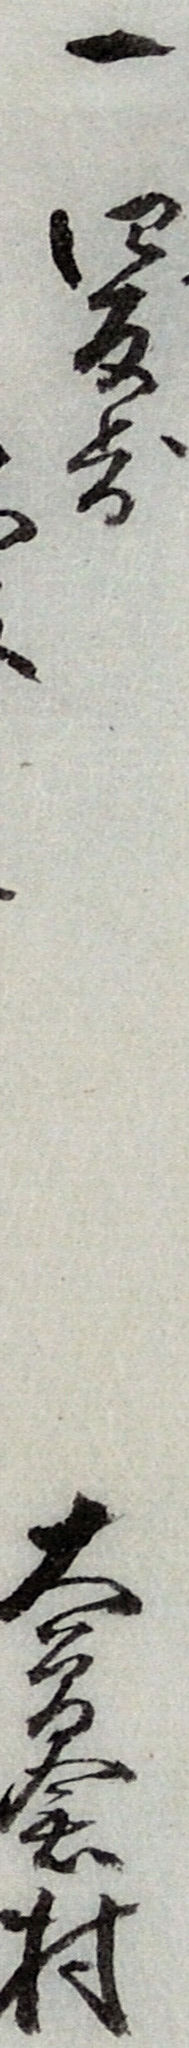一四反歩大曽倉村
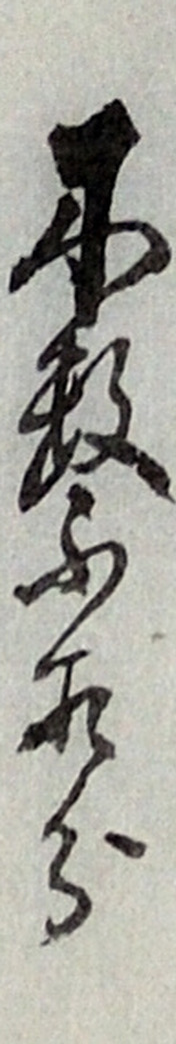木数不相分
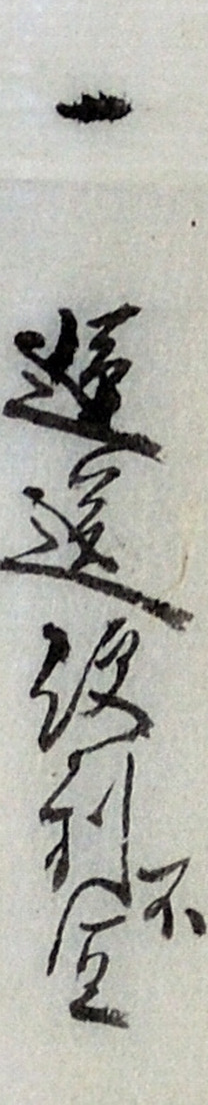一運送便利不宜
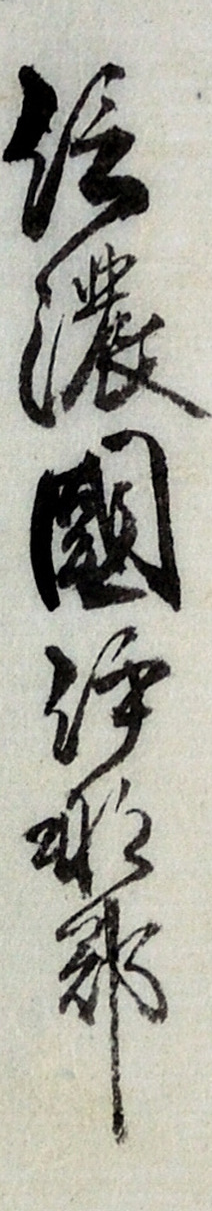信濃国伊那郡
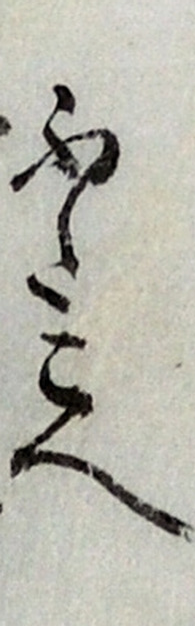ふたこへ
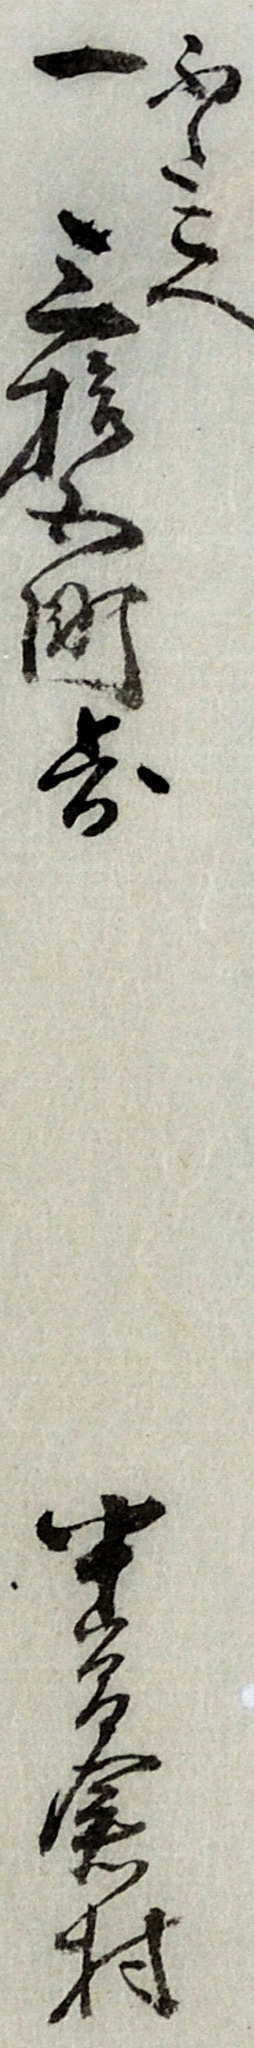一三拾五町歩中曽倉村
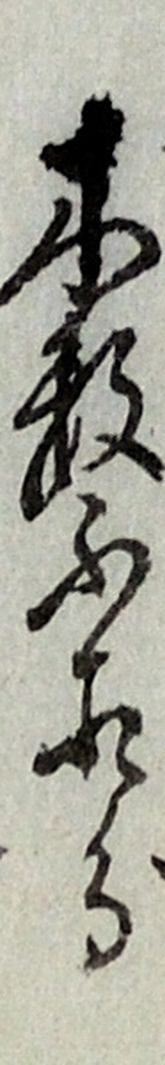木数不相分
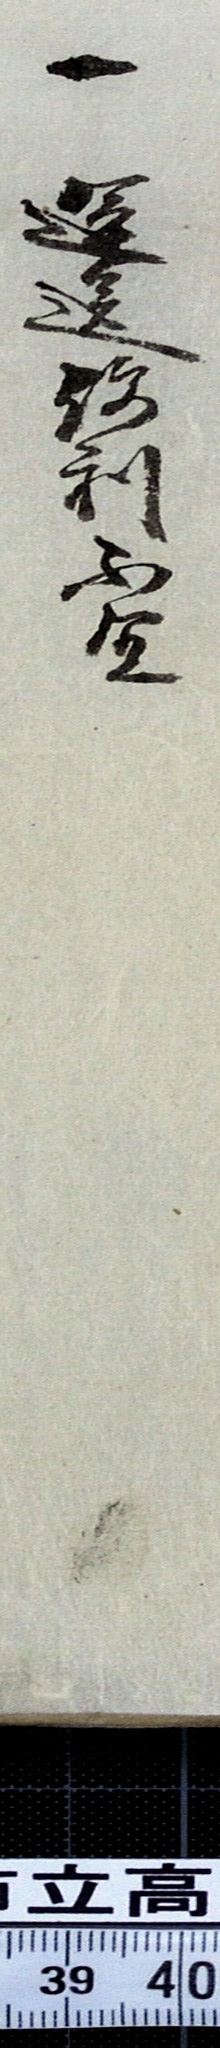一運送便利不宜
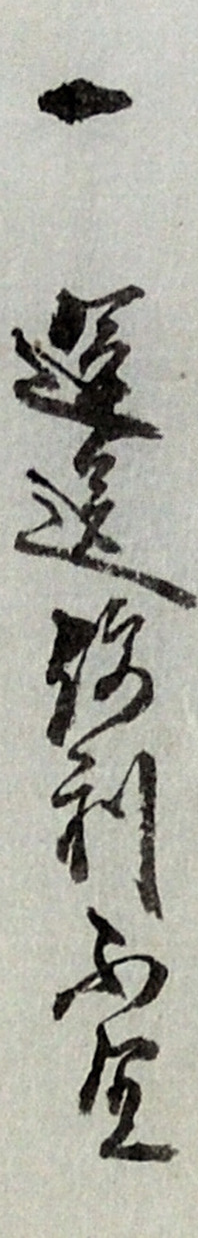一運送便利不宜

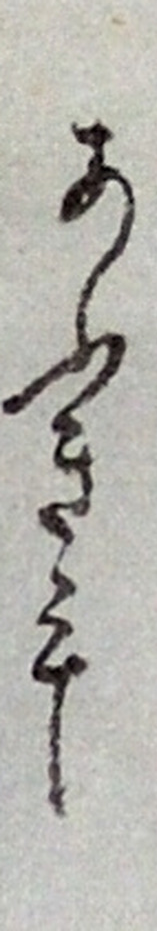あふき平
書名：官林反別帳
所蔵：伊那市立高遠町図書館・合同会社AMANE
